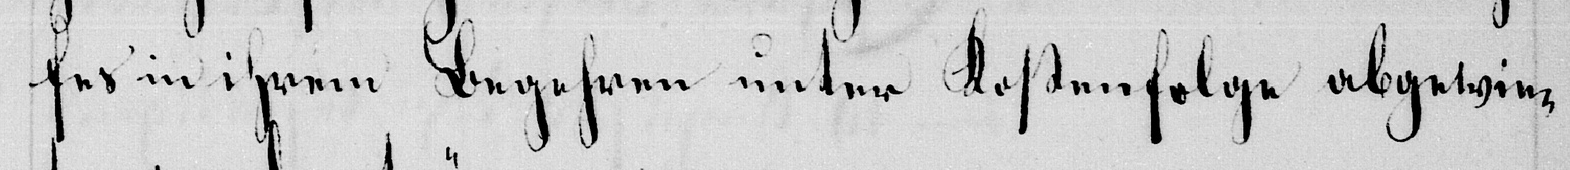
fes ihrem Begehren unter Kostenfolge abgewie¬
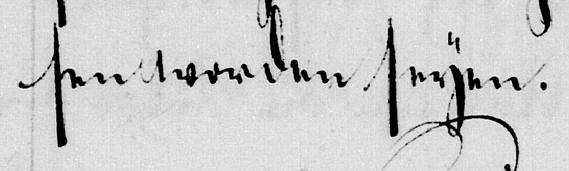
sen worden seyen.
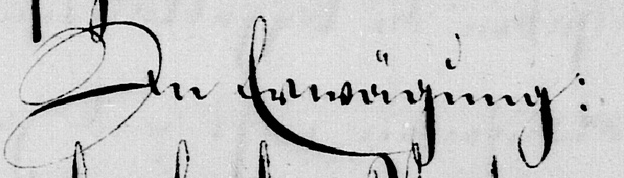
In Erwägung:
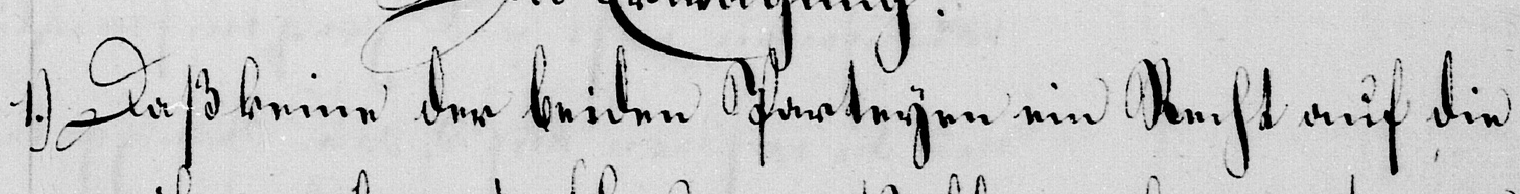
1.) Daß keine der beiden Parteyen ein Recht auf die
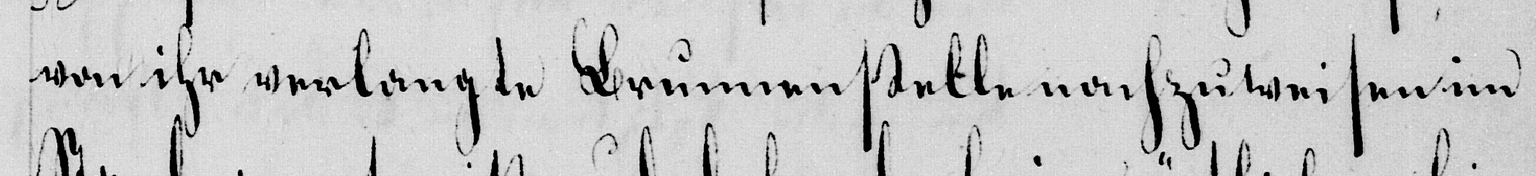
von ihr verlangte Brunnenstelle nachzuweisen im
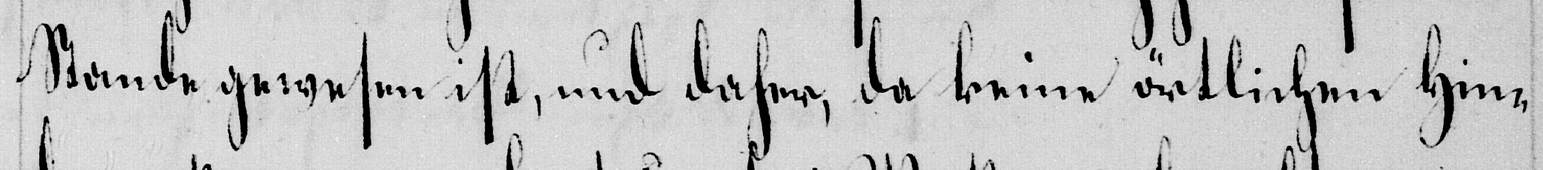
Stande gewesen ist, und daher, da keine örtlichen Hin¬
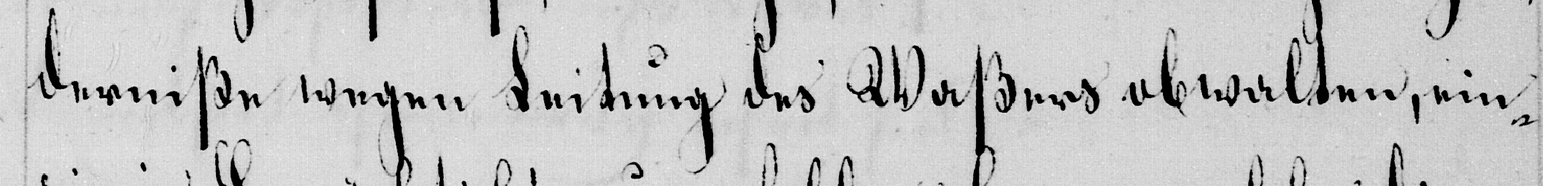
derniße wegen Leitung des Waßers obwalten, ein¬
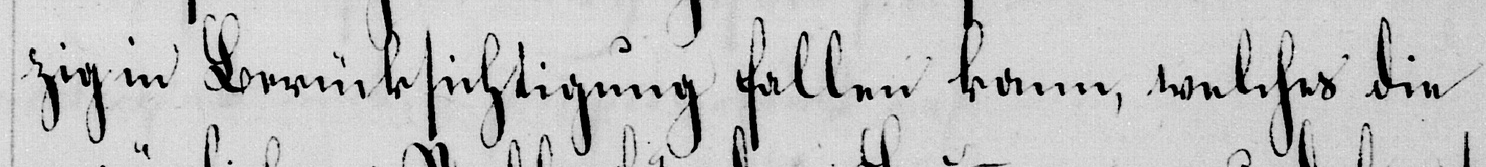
zig in Berücksichtigung fallen kann, welches die
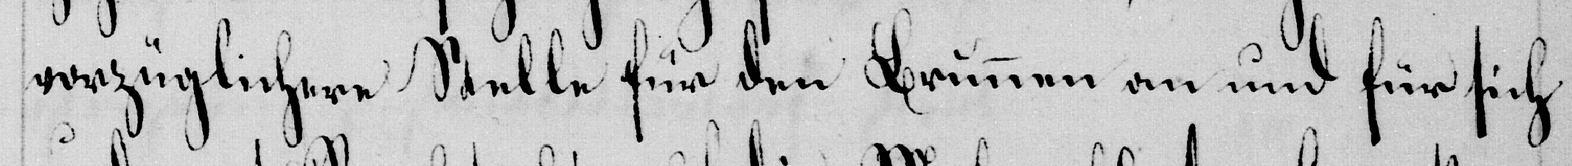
vorzüglichere Stelle für den Brunnen an und für sich
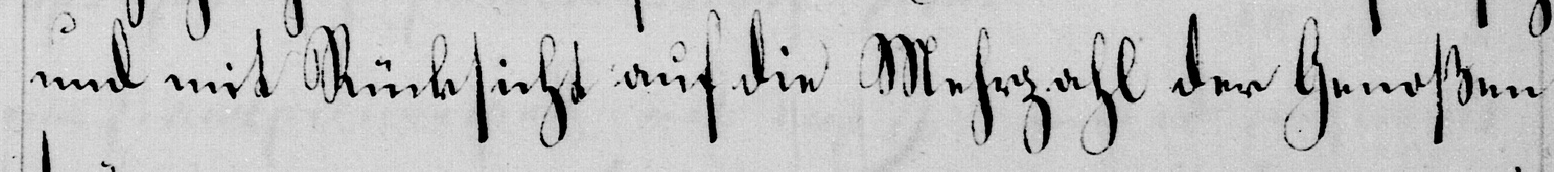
und mit Rücksicht auf die Mehrzahl der Genoßen
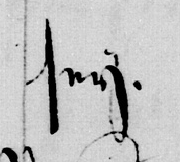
sey.
